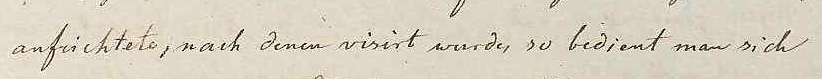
aufrichtete, nach denen visirt wurde, so bedient man sich
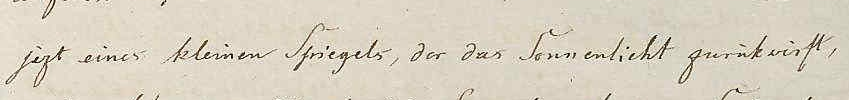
jetzt eines kleinen Spiegels, der das Sonnenlicht zurükwirft,
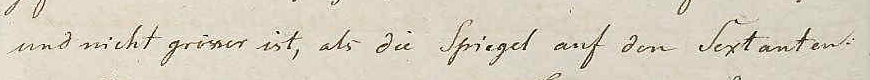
und nicht grösser ist, als die Spiegel auf den Sextanten:
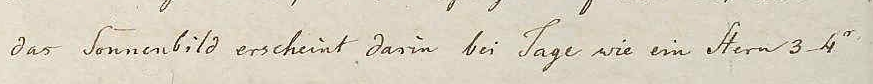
das Sonnenbild erscheint darin bei Tage wie ein Stern 3–4￼
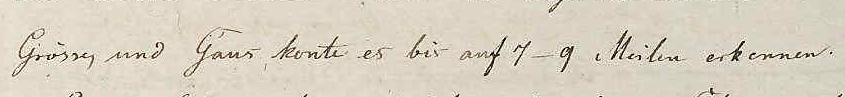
Grösse, und Gaus konnte es bis auf 7–9 Meilen erkennen.
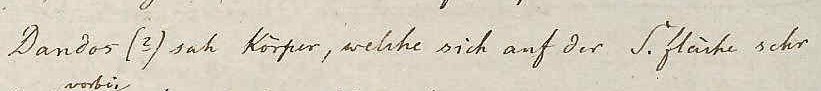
Dandos sah Körper, welche sich auf der S.fläche sehr
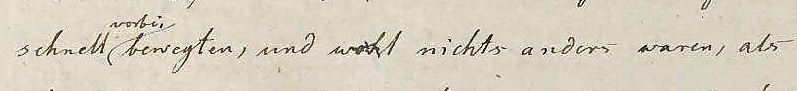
schnell vorbei bewegten, und wohl nichts anders waren, als
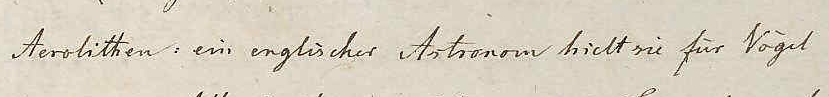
Aerolithen: ein englischer Astronom hielt sie für Vögel
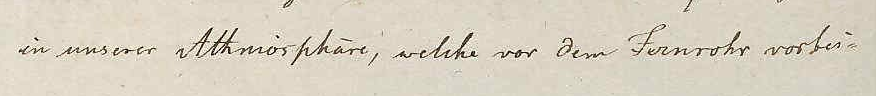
in unserer Athmosphäre, welche vor dem Fernrohr vorbei-
